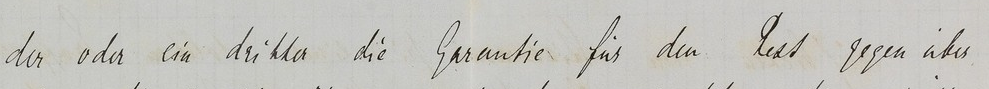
der oder ein dritter die Garantie für den Rest gegenüber
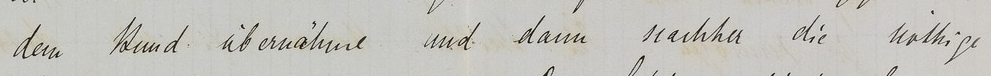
dem Bund übernähme und dann nachher die nöthige
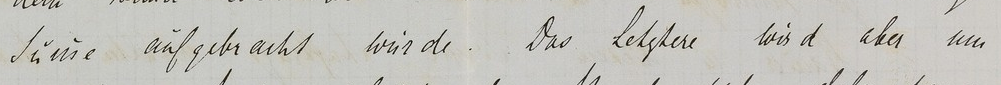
Summe aufgebracht würde. Das letztere wird aber um
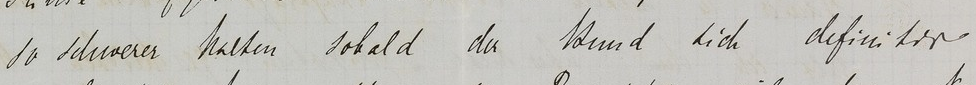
so schwerer halten sobald der Bund sich definitiv
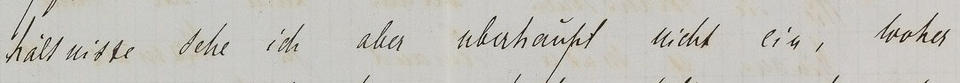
hältnisse sehe ich aber überhaupt nicht ein, woher
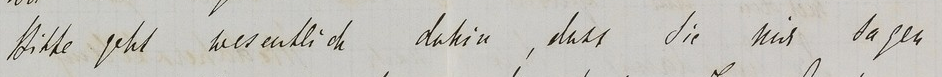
Bitte geht wesentlich dahin, dass Sie mir sagen
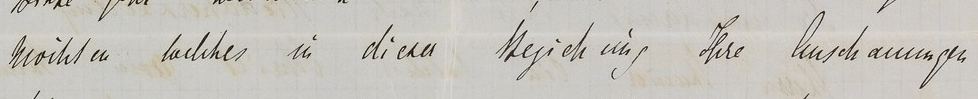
möchten welches in dieser Beziehung Ihre Anschauungen
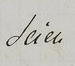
seien.
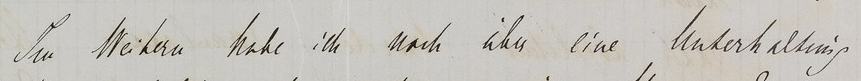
Im Weitern habe ich noch über eine Unterhaltung
